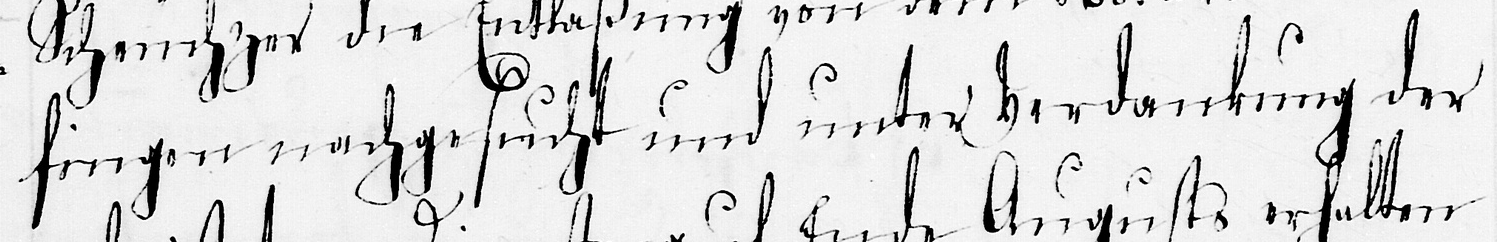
fingen nachgesucht und unter Verdankung der
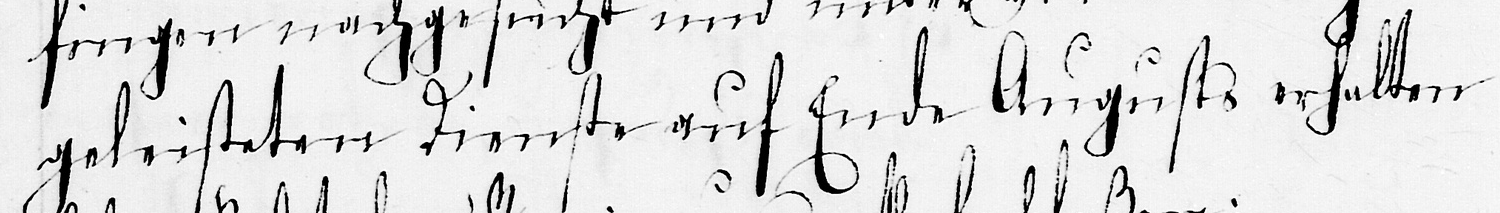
geleisteten Dienste auf Ende Augusts erhalten
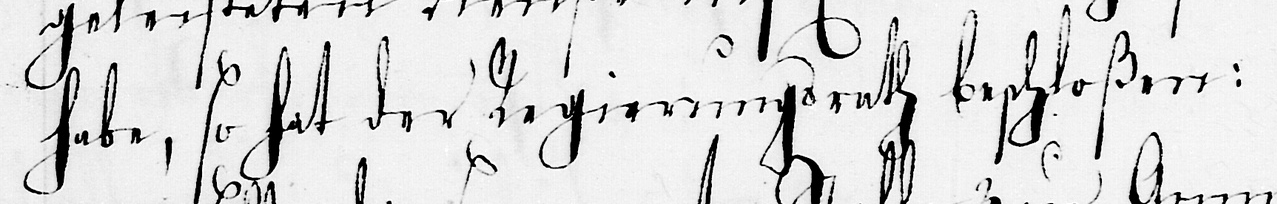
habe, so hat der Regierungsrath beschloßen:
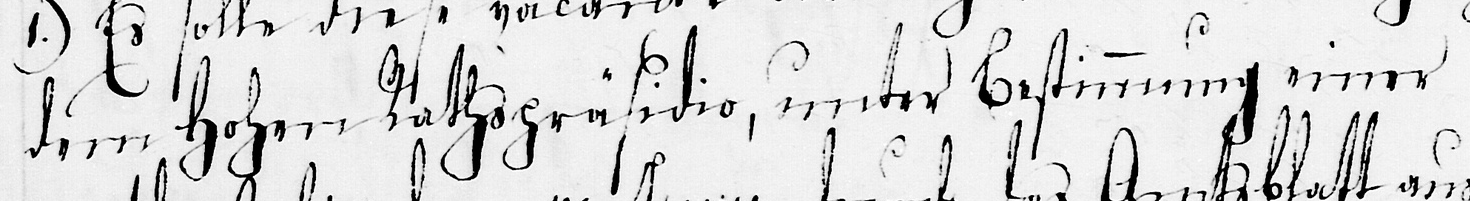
dem Hohen Rathspräsidio, unter Bestimmung einer
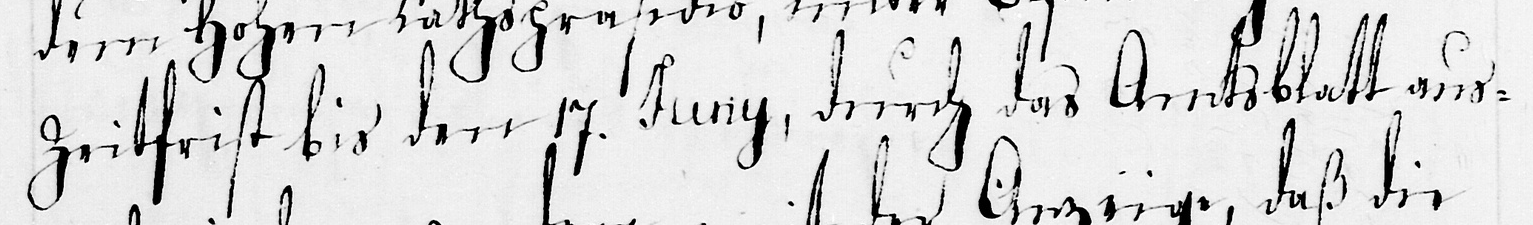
Zeitfrist bis den 17. Juny, durch das Amtsblatt aus¬
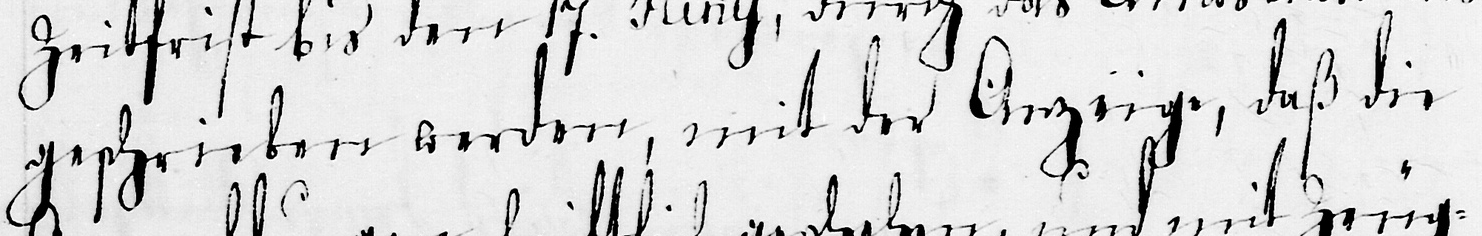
geschrieben werden, mit der Anzeige, daß die
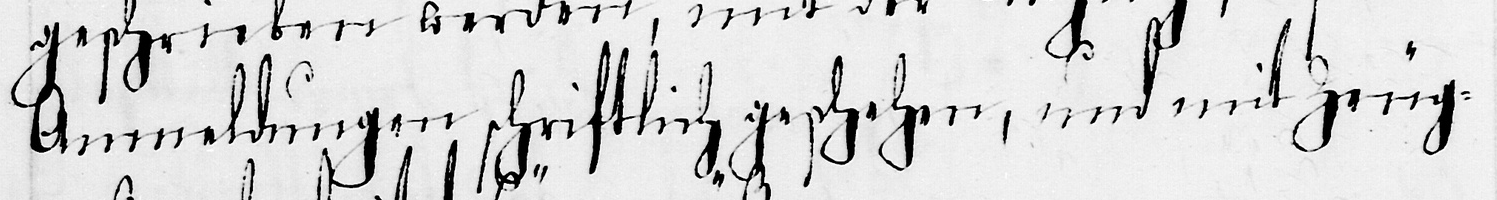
Anmeldungen schriftlich geschehen, und mit Zeug¬
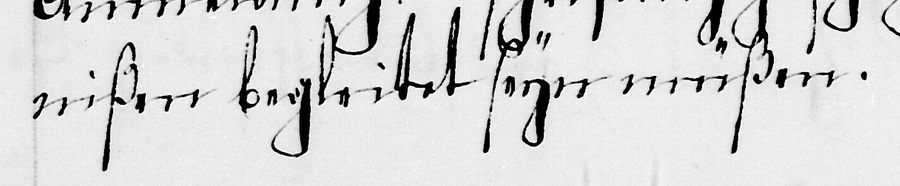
nißen begleitet seyn müßen.
